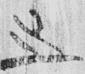之
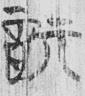○（忌）
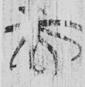而
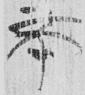不
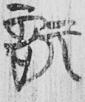○（忌）
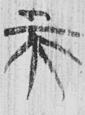天
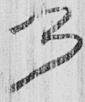乃
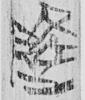○（降）
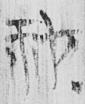○（災）
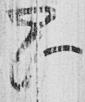已
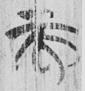而
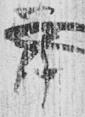不
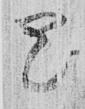已
